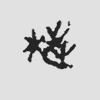桃
